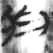於
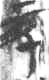亥
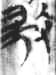○（怨）
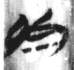於
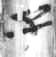子
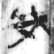凡
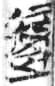○（復）
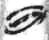日
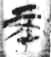不
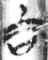吉
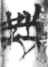無
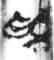爲
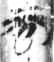而
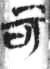可
